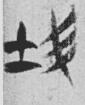○（郤）
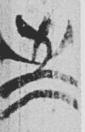至
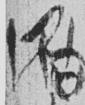姑（苦）
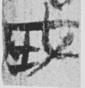○（成）
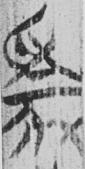{爪家}
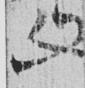父
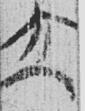立
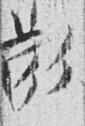死
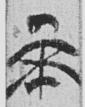不
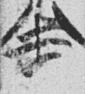用
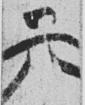亓（其）
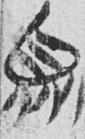衆
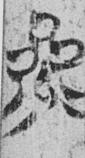參（三）
